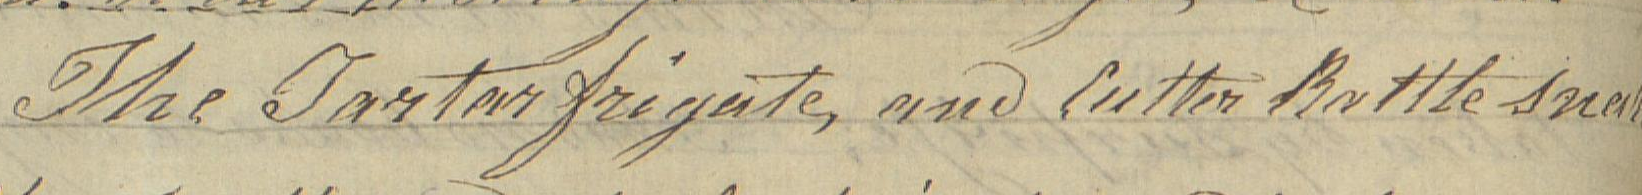The Tartar frigate, and Cutter Battle snake
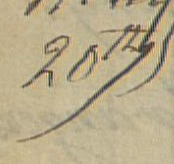20^th
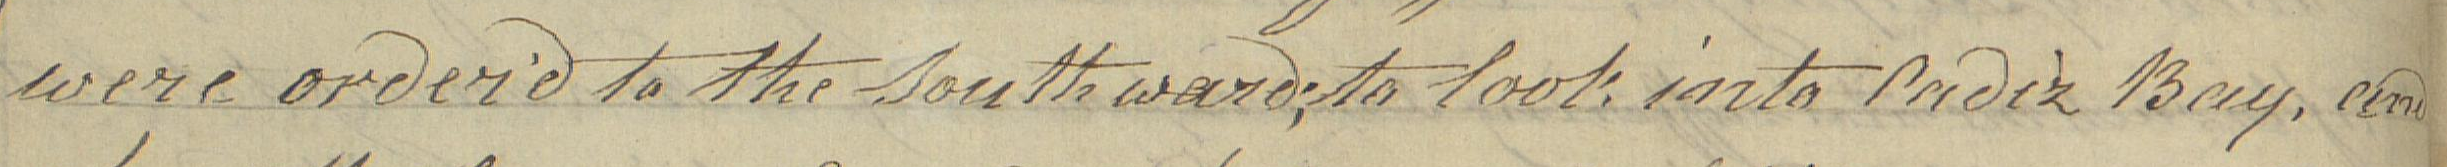were order'd to the Southward; to Cool. into Cadiz Bay, and
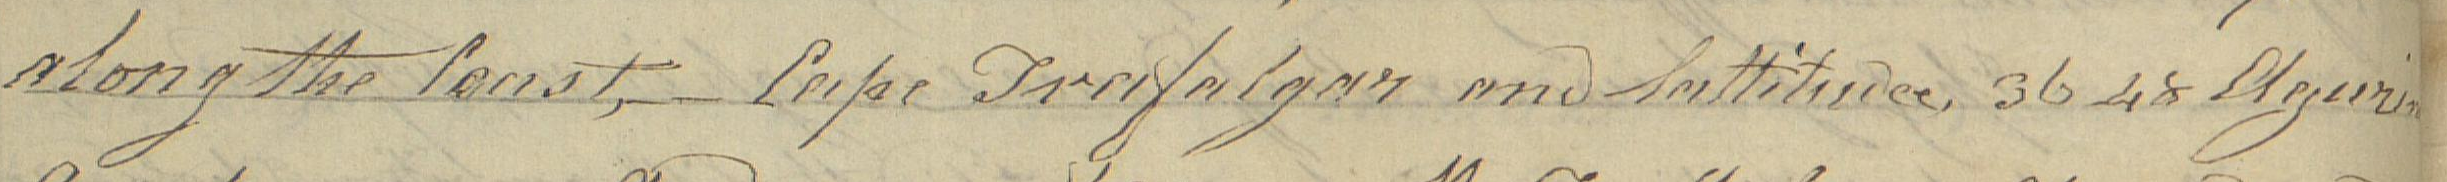along the Coast, Cape Trafalgar and lattitude, 36 48 Agur-
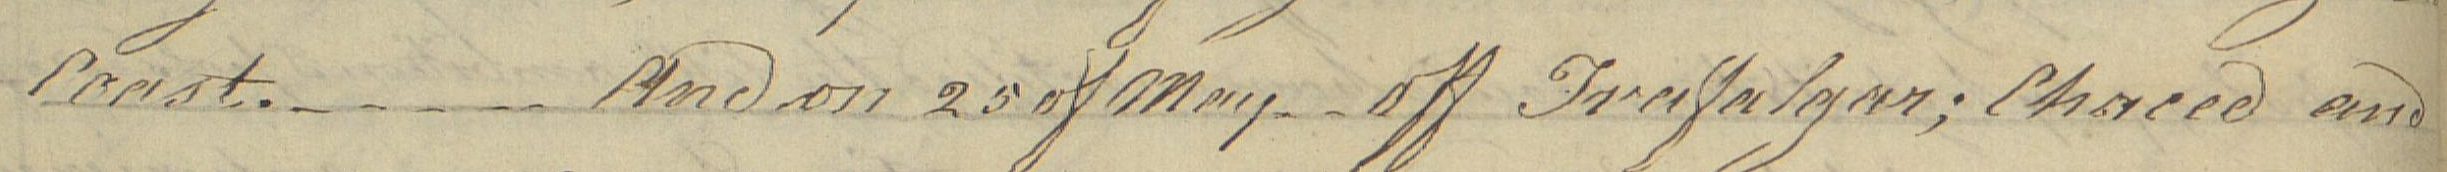Coast. And on 25 of May Off Trafalgar; Chaced and
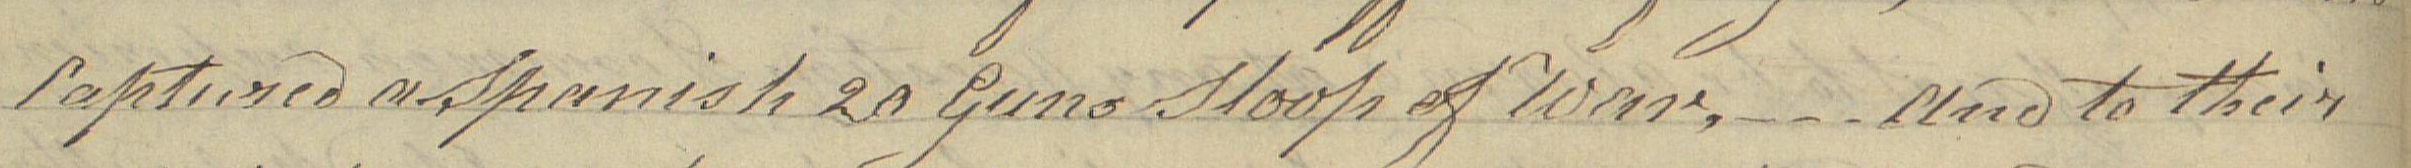captured a Spanish 20 Guns Sloop of War, And to their
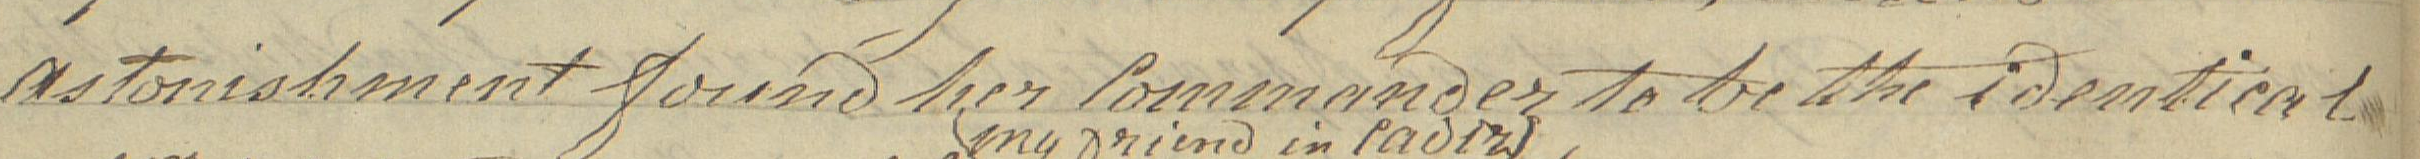astonishment found her Commander to be the identical
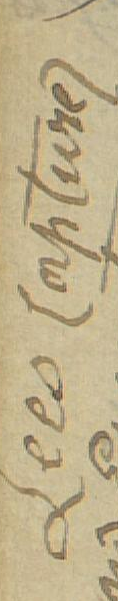Lecs Capture
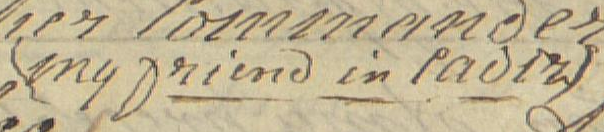(my friend in Cadiz)
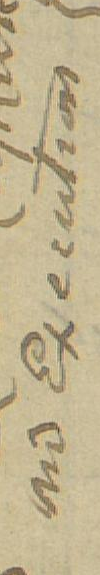no Execution
